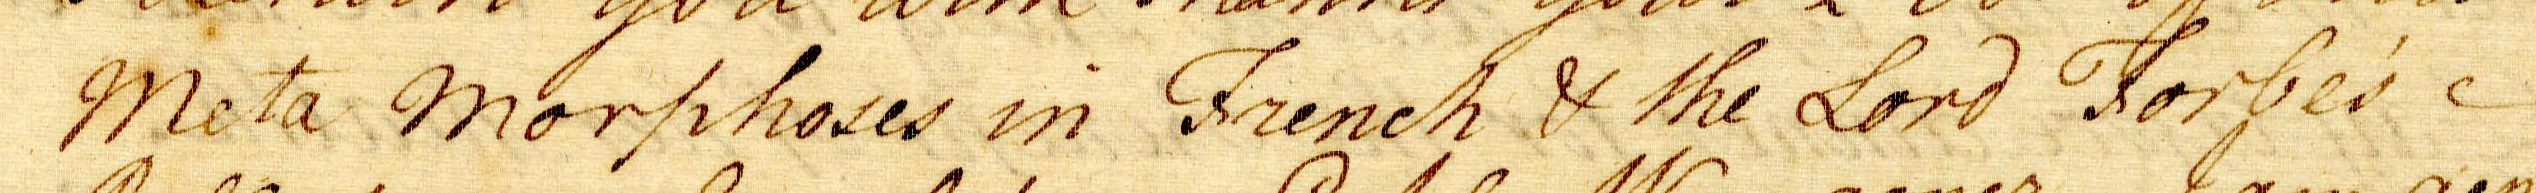Meta Morphoses in French & the Lord Forbe's c
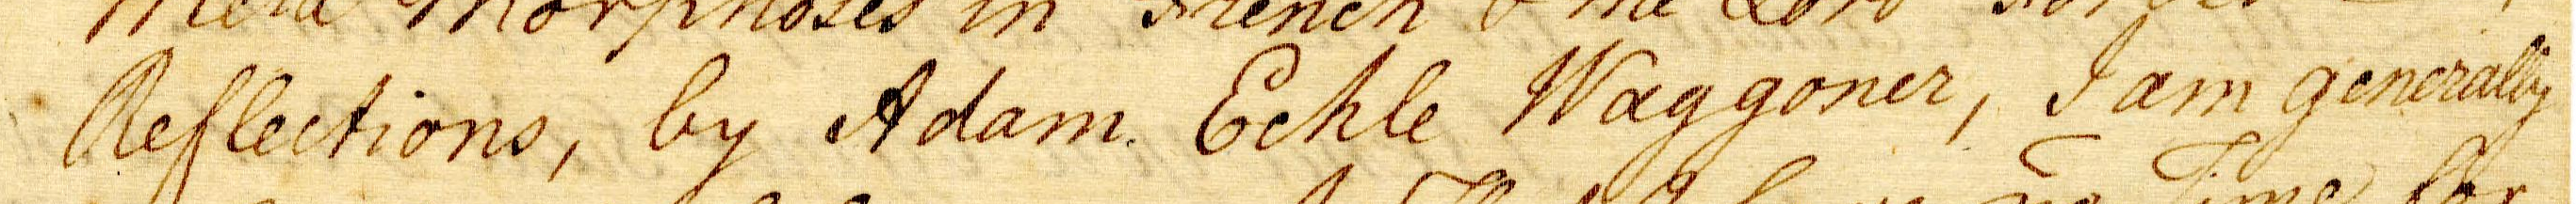Reflections, by Adam Eckle Waggoner, I am generally
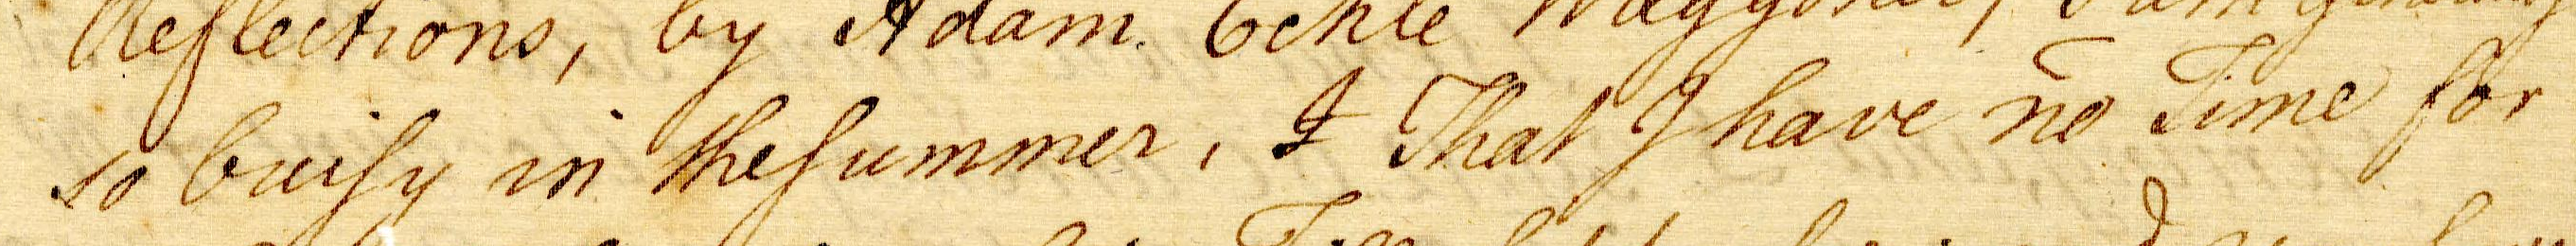so busy in the summer, [I] That I have no Time for
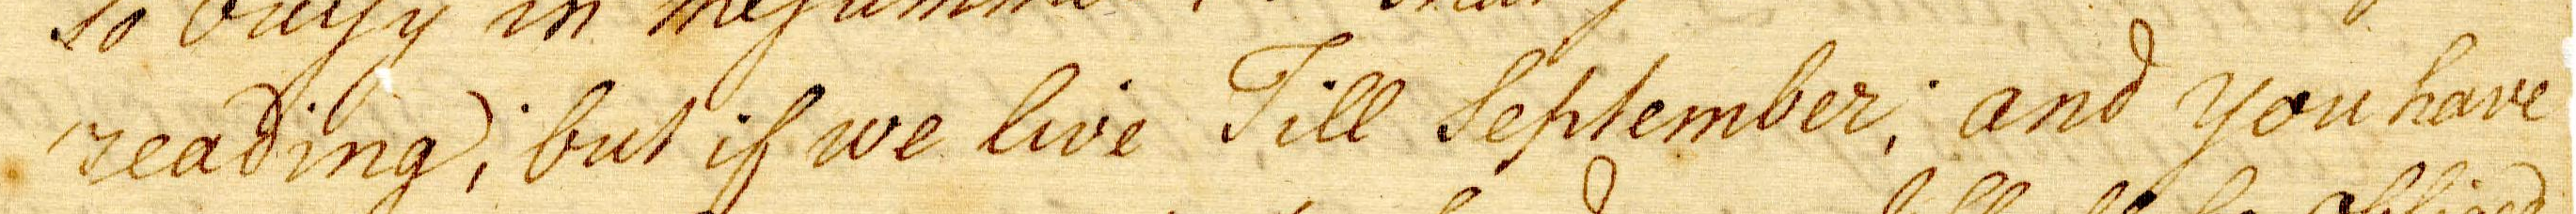reading; but if we live Till September; and You have
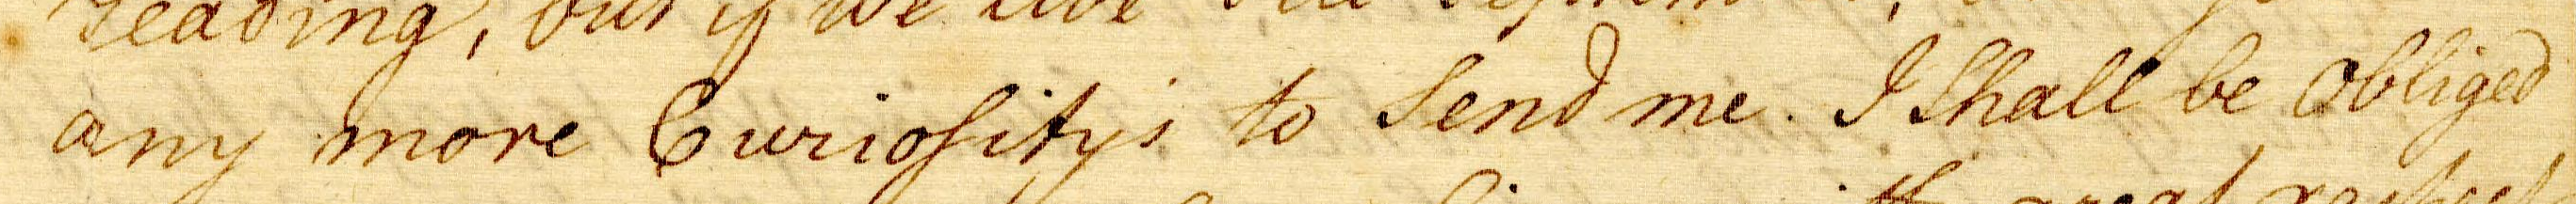any more Curiosity's to send me. I shall be obliged
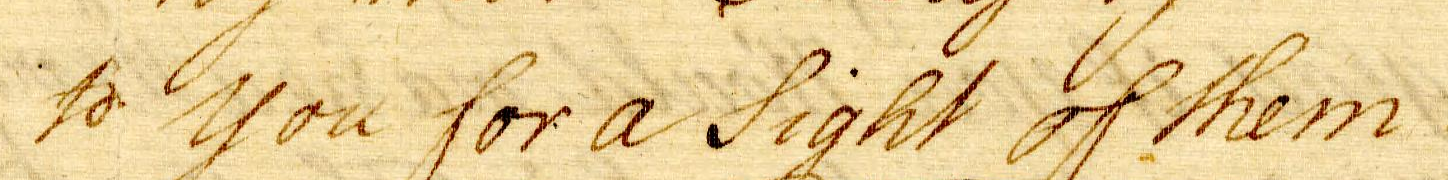to You for a Sight of them
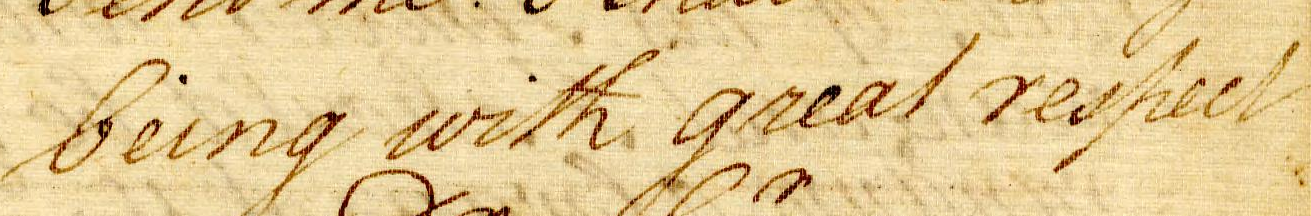being with great respect
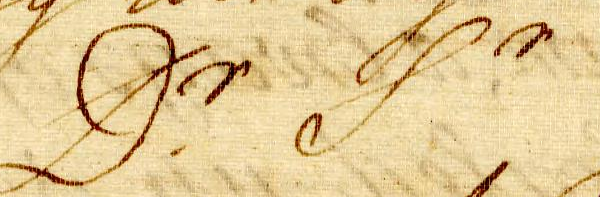D^r S^r
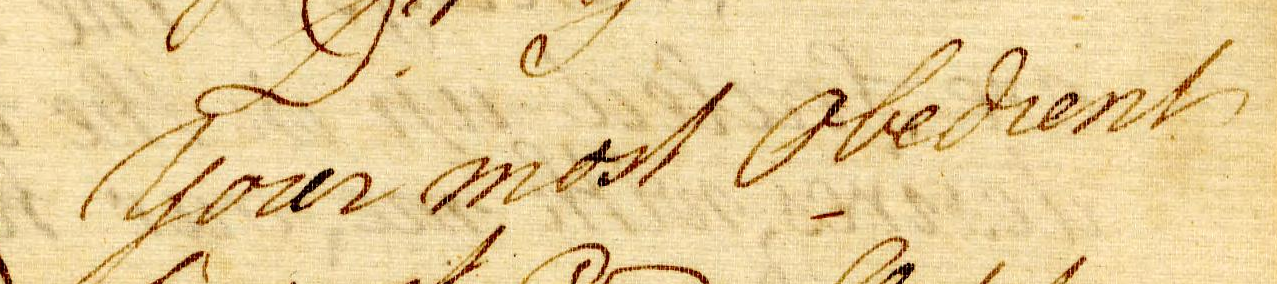Your most Obedient
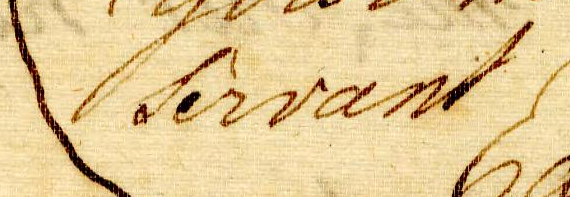servant
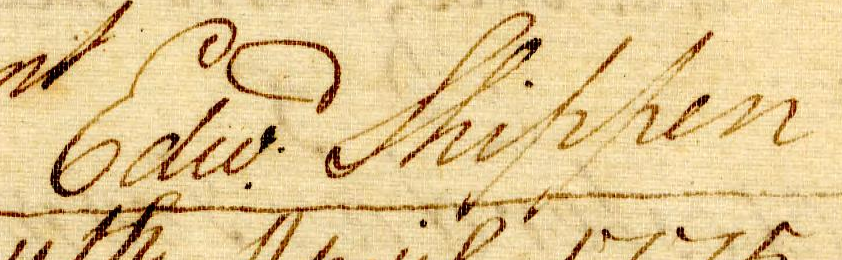Edw^d. Shippen
